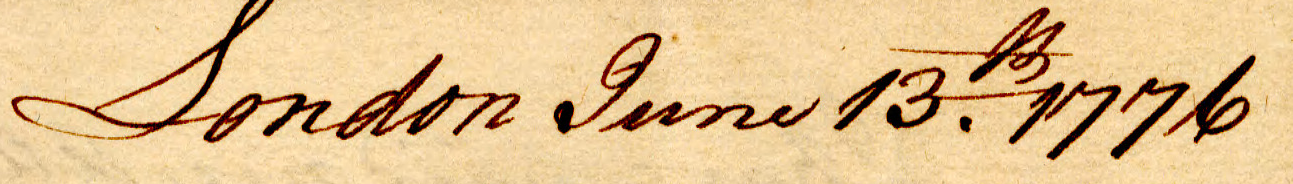London June 13.^th 1776
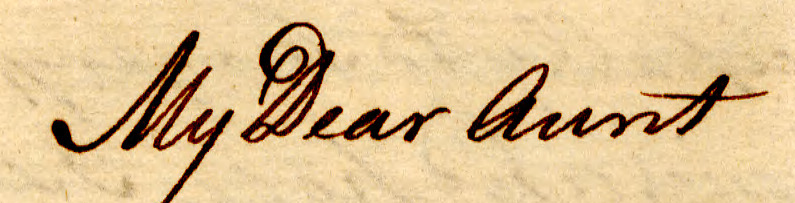My Dear Aunt
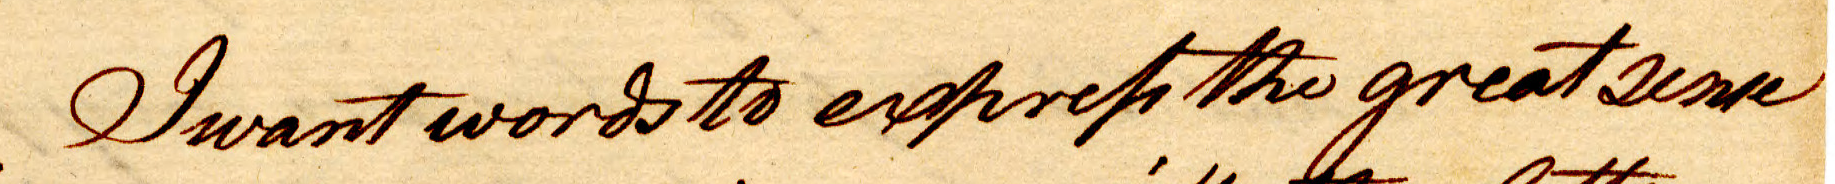I want words to express the great sense
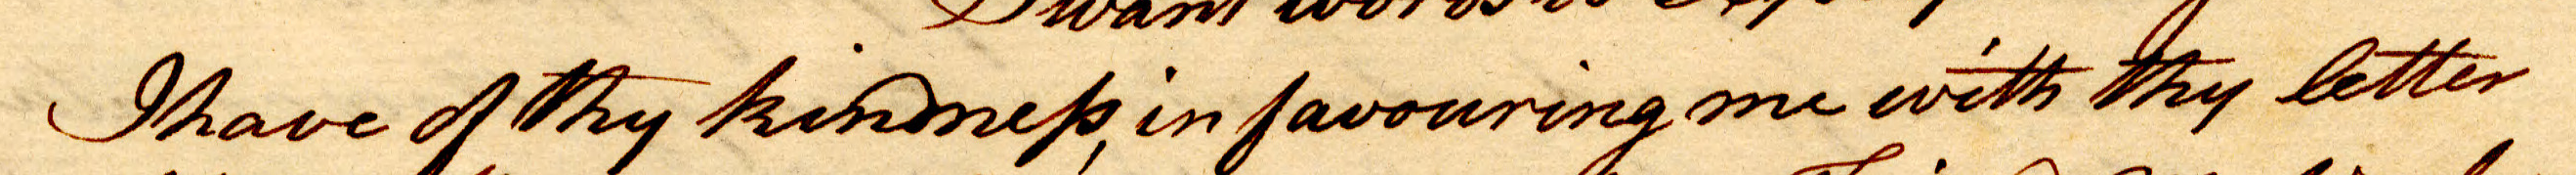I have of thy kindness, in favouring me with thy letter
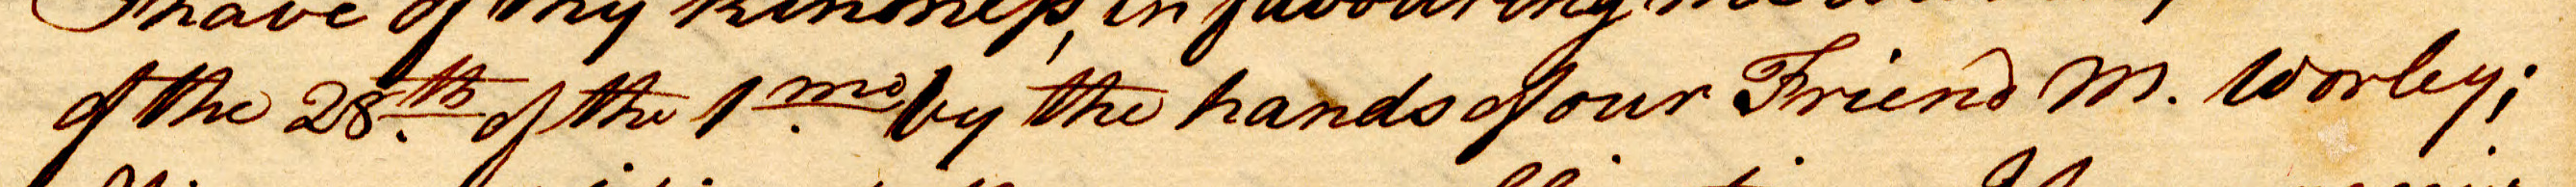of the 28^th. of the 1^mo. by the hands of our Friend M. Worley;
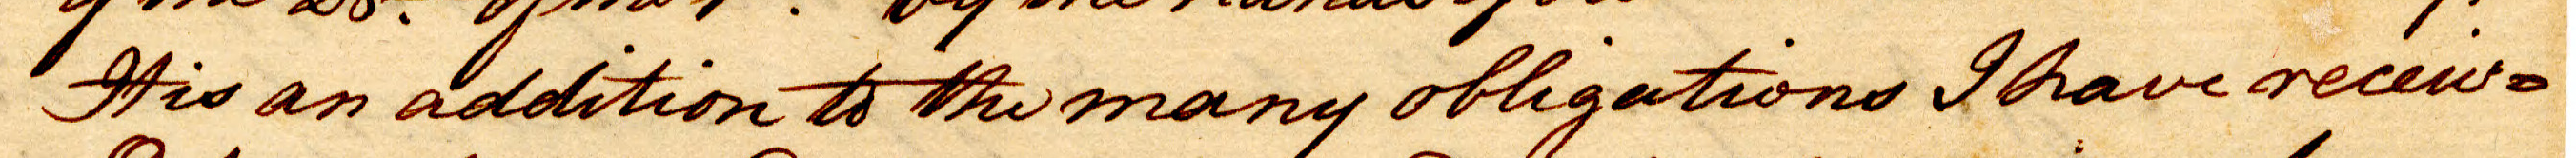It is an addition to the many obligations I have receiv-
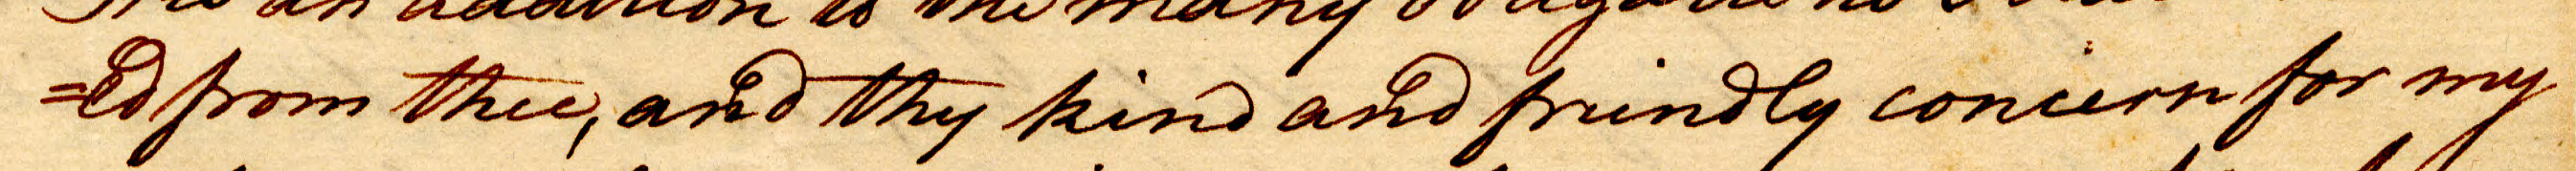-ed from thee, and thy kind and friendly concern for my
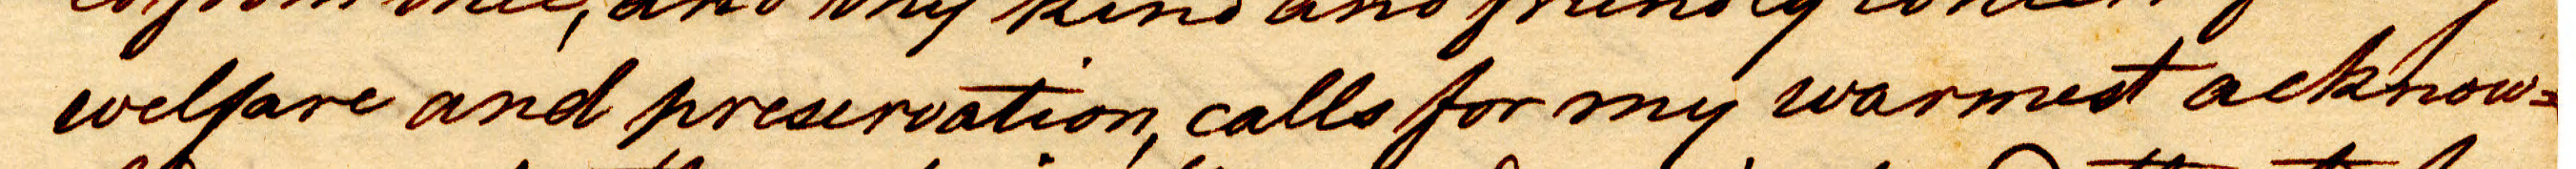welfare and preservation, calls for my warmest acknow-
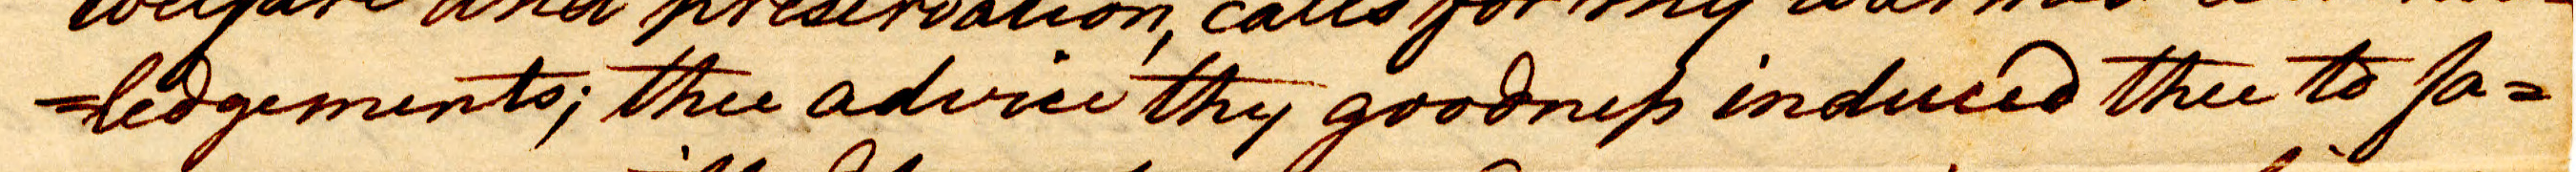-ledgements; thee advice thy goodness induced thee to fa-
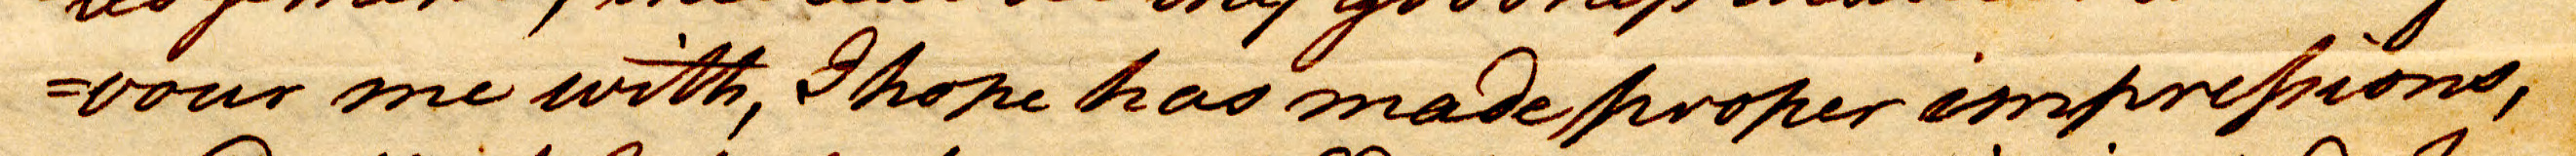-vour me with, I hope has made proper impressions,
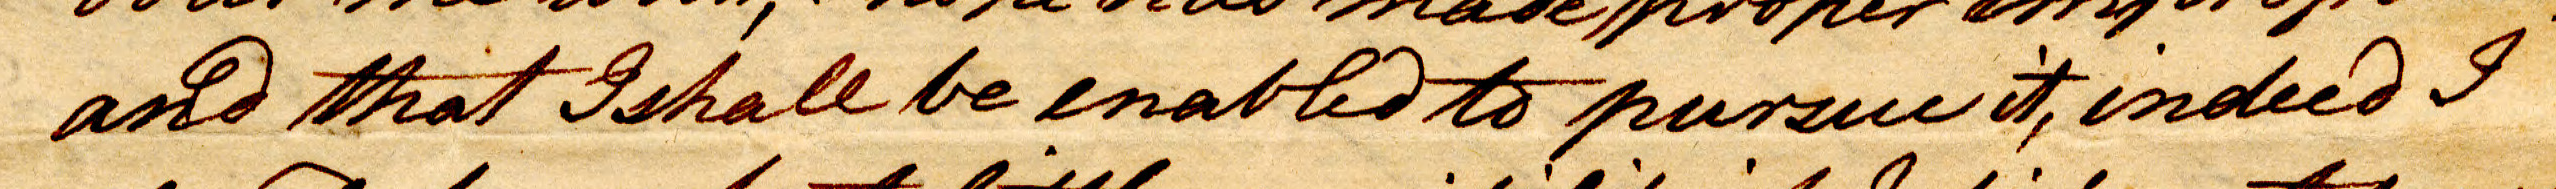and that I shall be enabled to pursue it, indeed I
